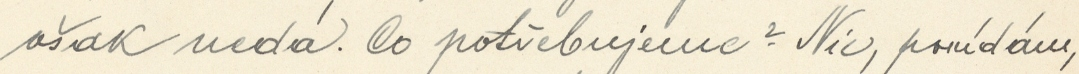však nedá. Co potřebujeme? Nic, povídám,
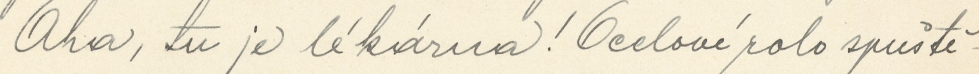Aha, tu je lékárna! Ocelové rolo spuště-
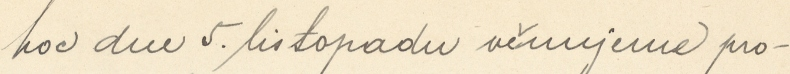Noc dne 5. listopadu věnujeme pro-
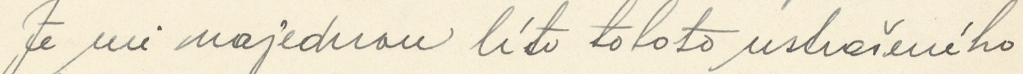Je mi najednou líto tohoto ustrašeného
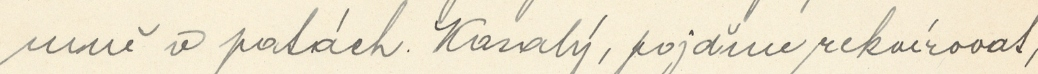mně v patách. Kasalý, pojďme rekvírovat,
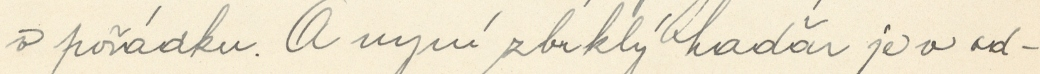v pořádku. A nyní zbrklý Maďar je v od-
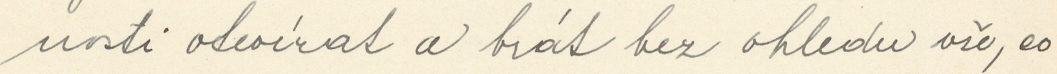nosti otevírat a brát bez ohledu vše, co
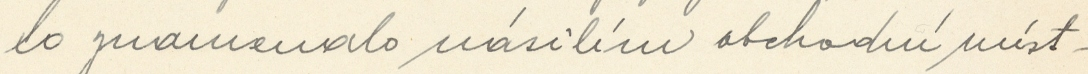to znamenalo násilím obchodní míst-
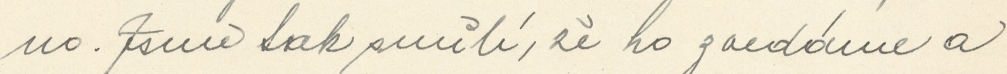no. Jsme tak smělí, že ho zvedáme a
